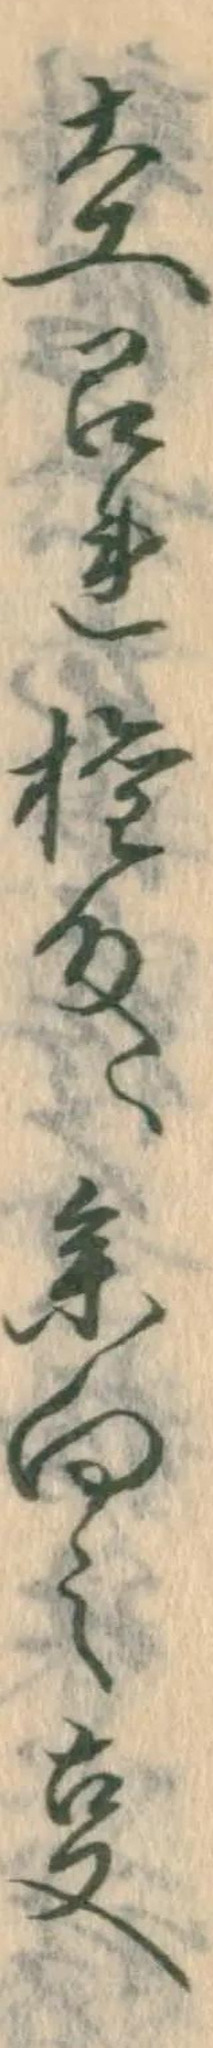大工召連権殿へ参向之事
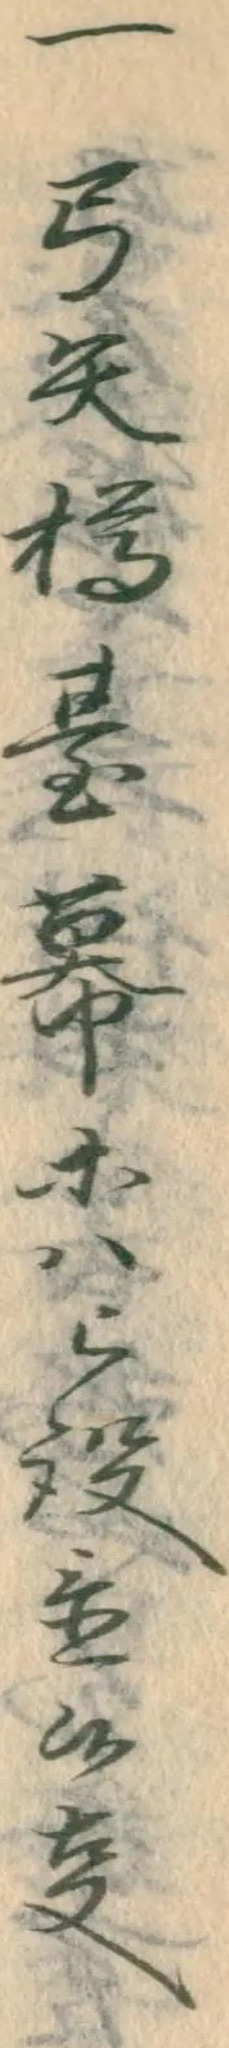一弓矢樽台幕等ハ被設置候事
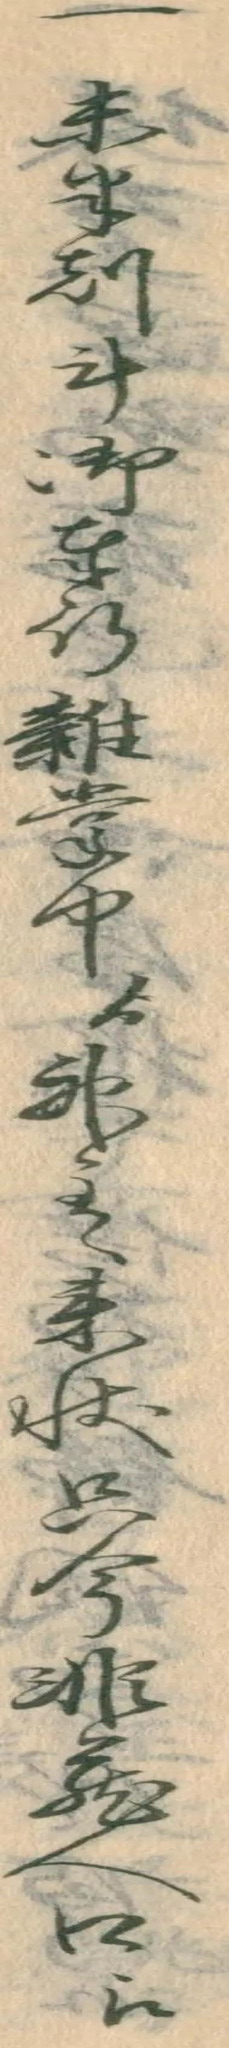一未半刻計御奉行雑掌中ゟ神主へ来状只今非蔵人口江
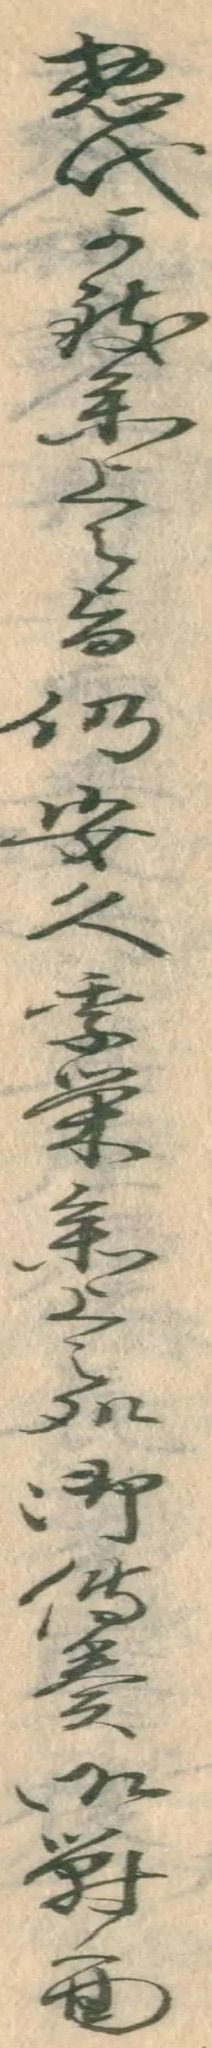惣代可致参上之旨仍安久季栄参上之処御伝奏御対面
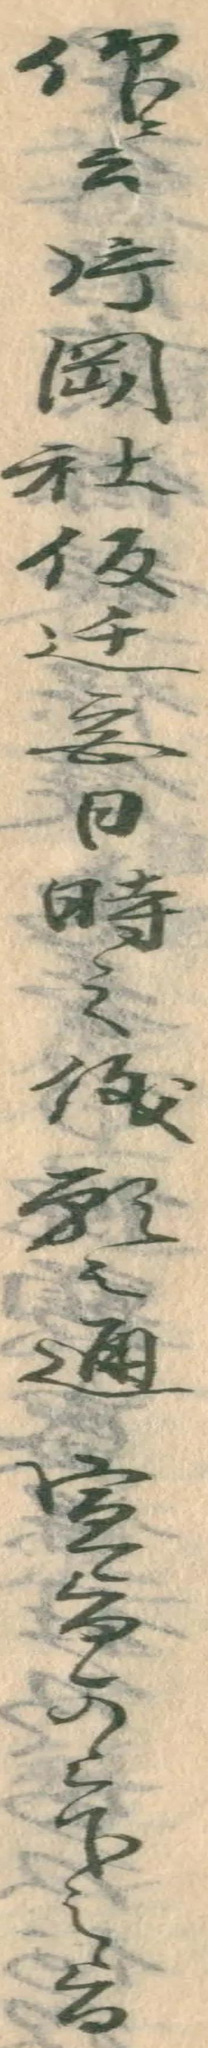仰ニ云片岡社仮迁宮日時之儀願之通宣旨可被下之旨
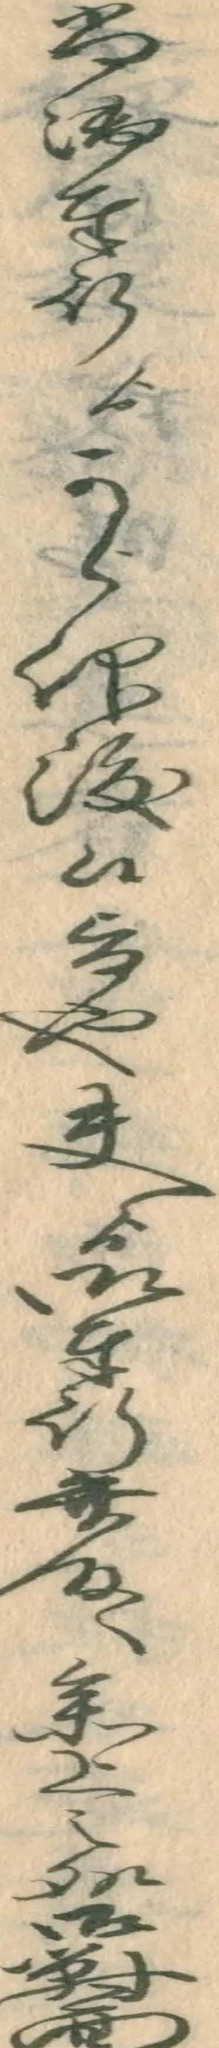尚御奉行ゟ可被仰渡候旨也夫ゟ御奉行弁殿へ参上之処御対面
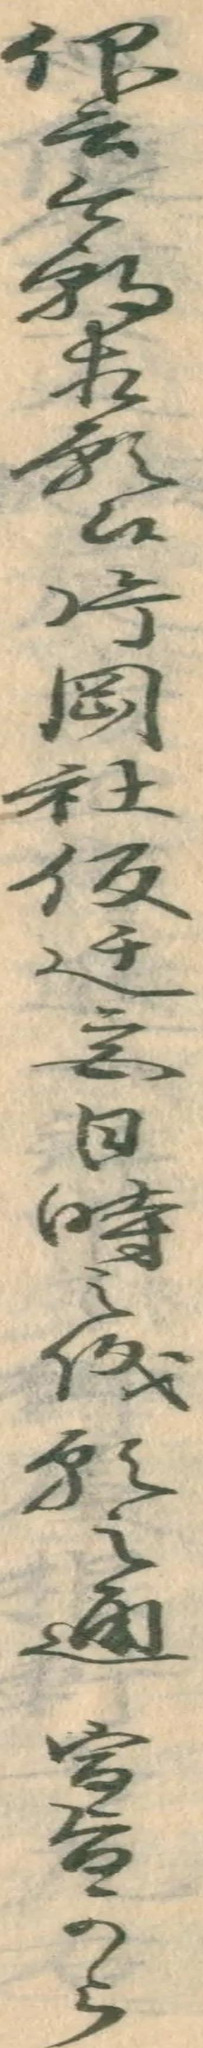仰云今朝相願候片岡社仮迁宮日時之儀願之通宣旨可被
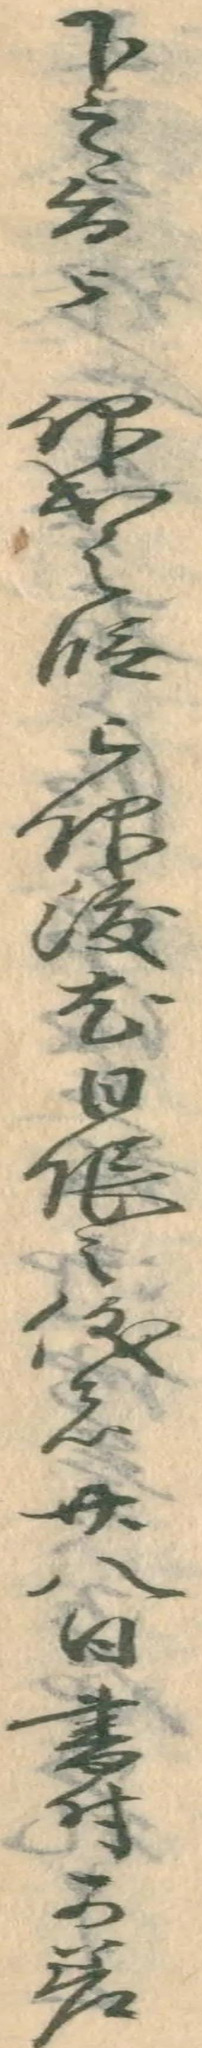下之旨被仰出之段被仰渡尤日限之儀は廿八日書付可差

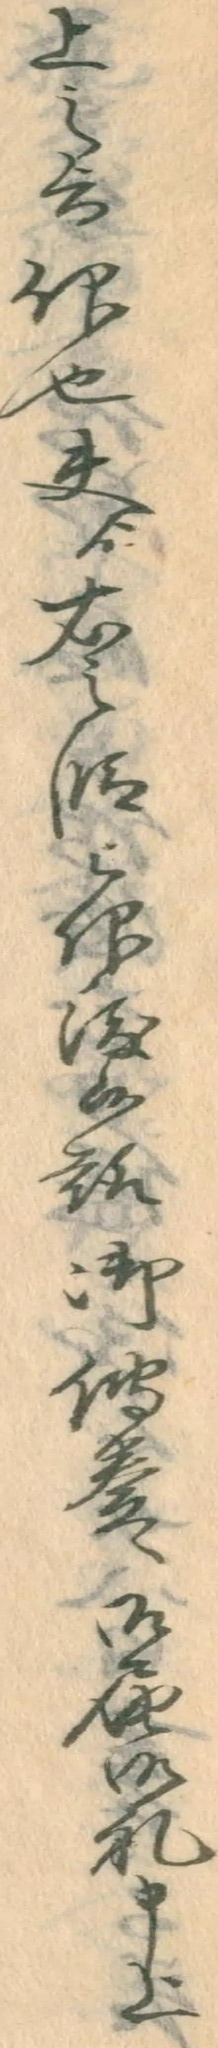上之旨仰也夫ゟ右之段被仰渡候趣御伝奏へ御届御礼申上
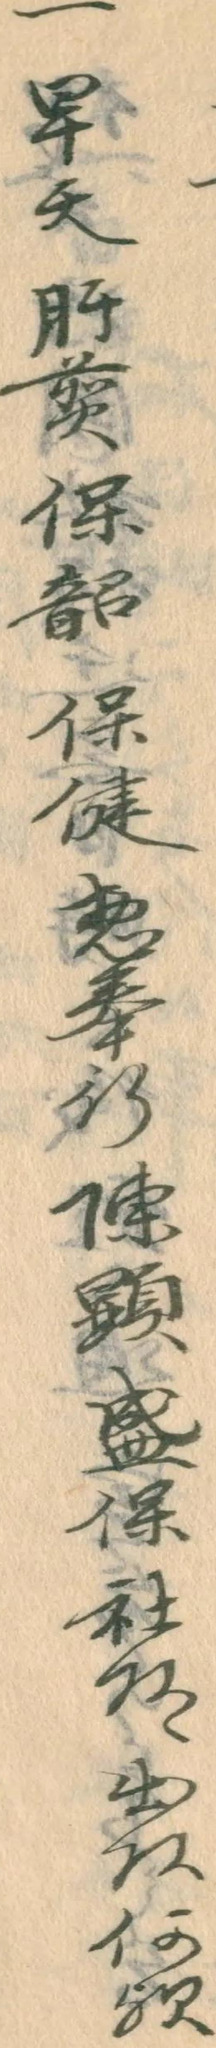一早天肝煎保韶保健惣奉行陳顕盛保社頭へ出頭何歟
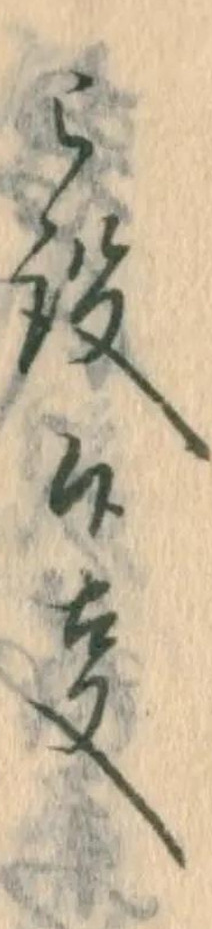被設候事
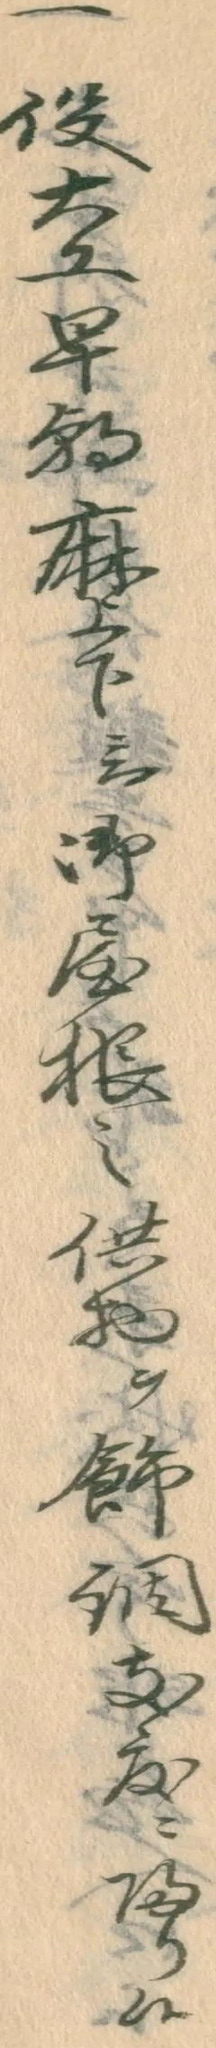一役大工早朝麻上下ニ而御屋根之供物ヲ飾調支度ニ帰り候
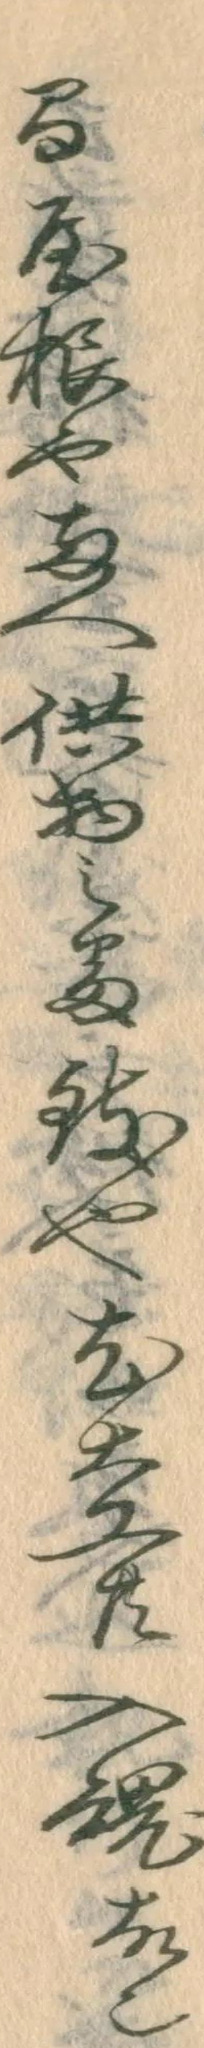間屋根や両人供物之番致也尤大工共入魂故也
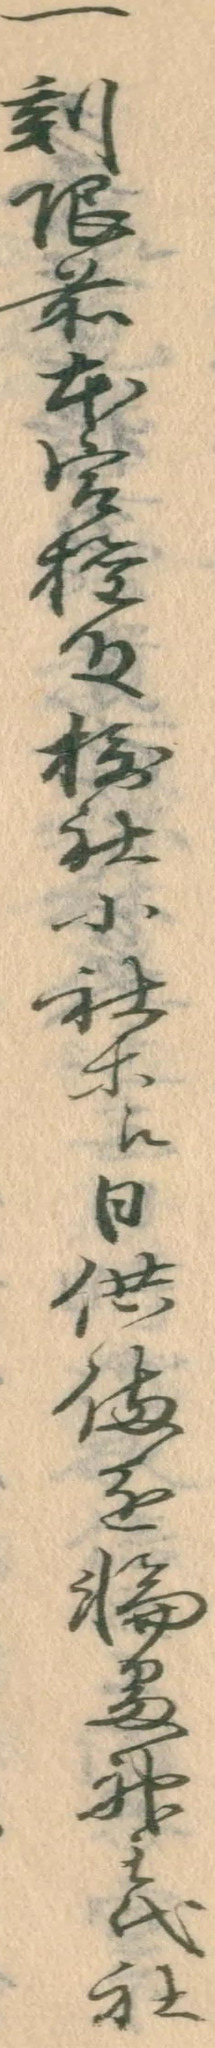一刻限前本宮権殿摂社小社等江日供備進輪番神主代社
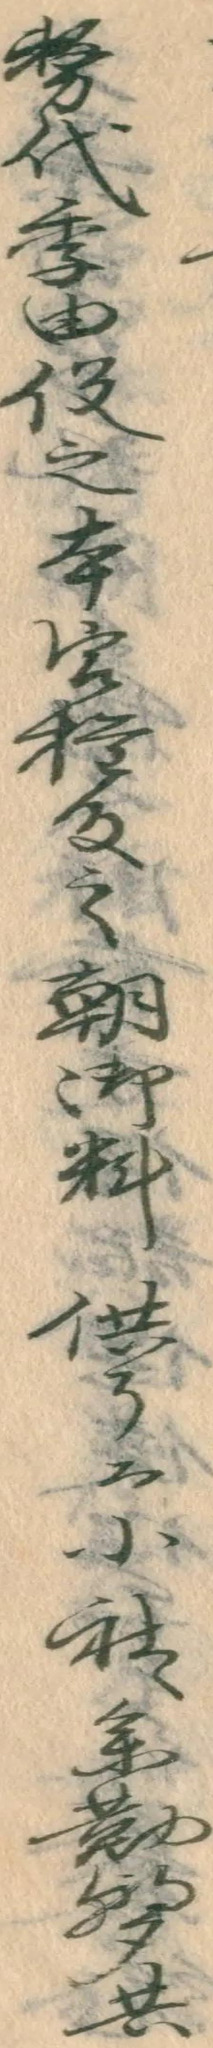務代季由役之本宮権殿之朝御料供予而小社へ参勤朝夕共
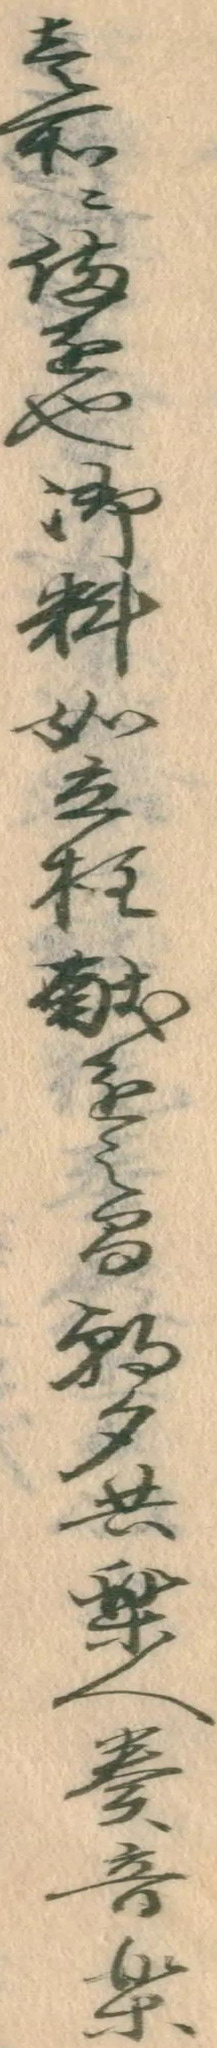壱所ニ備進也御料如立柱献進之間朝夕共楽人奏音楽
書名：賀茂社記録. 第17冊
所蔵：国立国会図書館 National Diet Library, JAPAN
